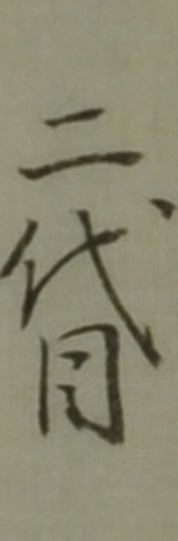二代目
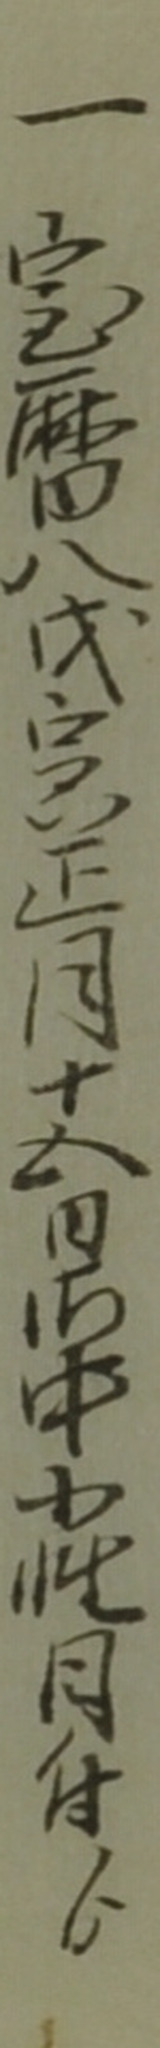一宝暦八戊寅正月十五日御中小姓目付より
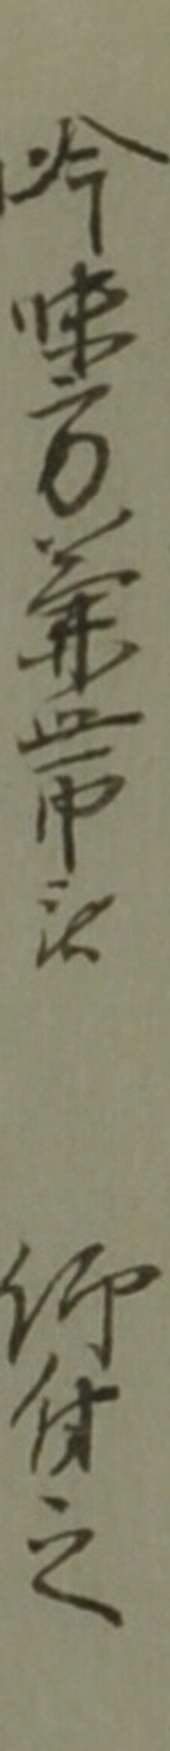吟味方兼帯被仰付之
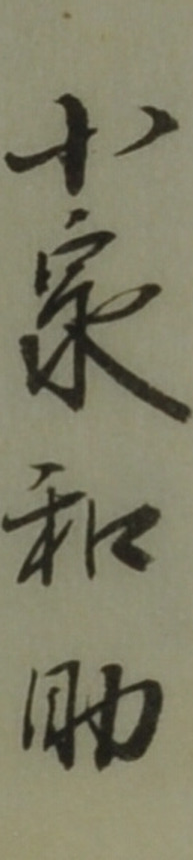小家和助
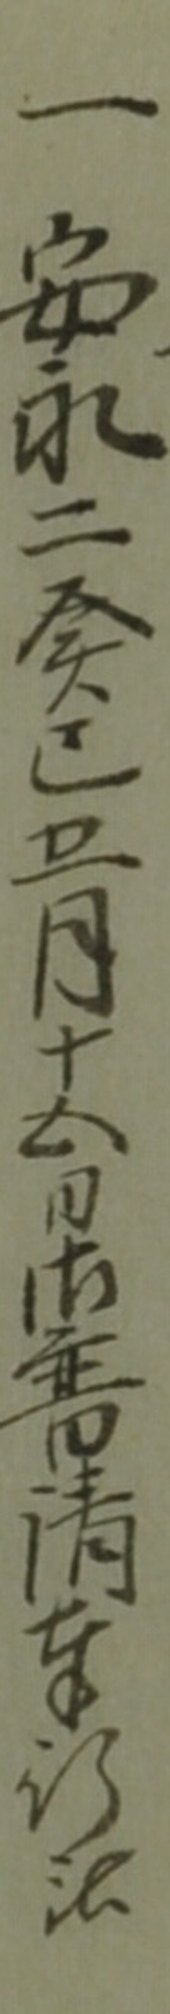一安永二癸巳五月十五日御普請奉行被
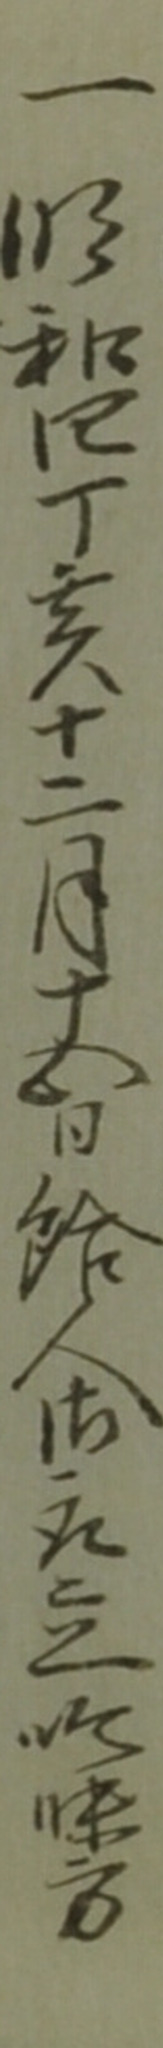一明和四丁亥十二月十五日給人御取立吟味方
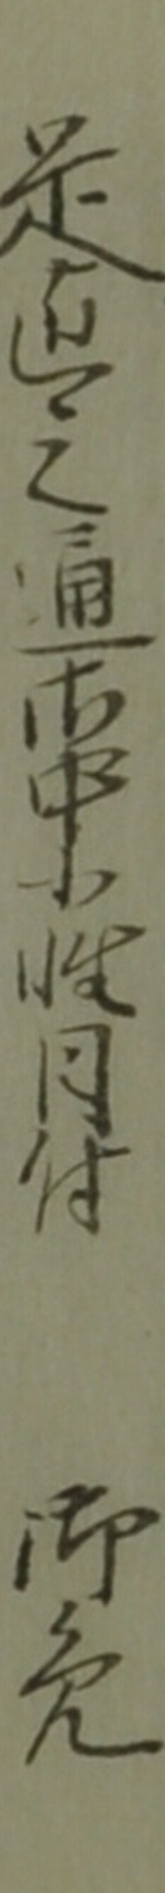是迄之通御中小姓目付御免
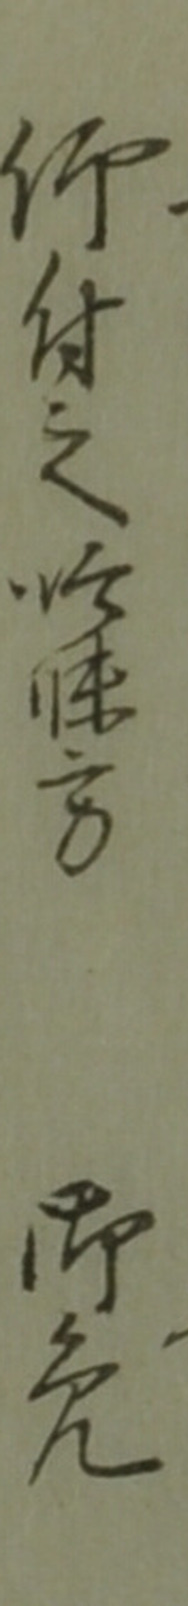仰付之吟味方御免
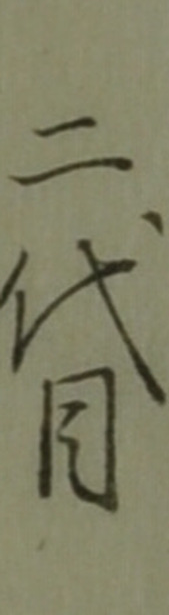二代目
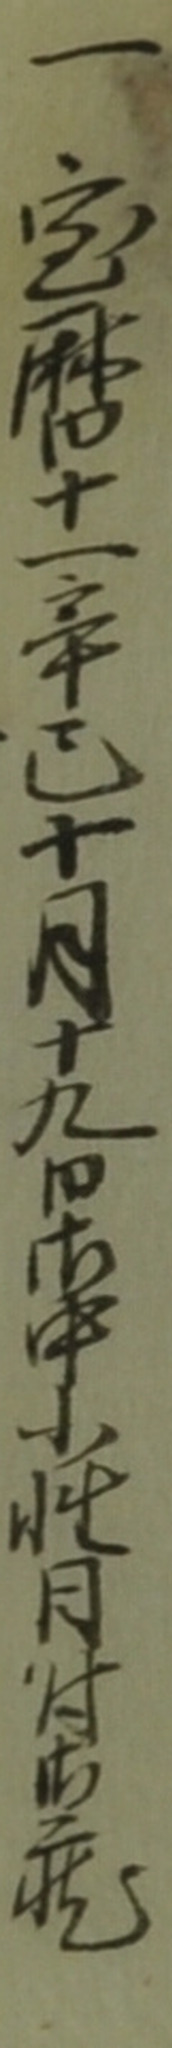一宝暦十一辛巳十月十九日御中小姓目付御蔵
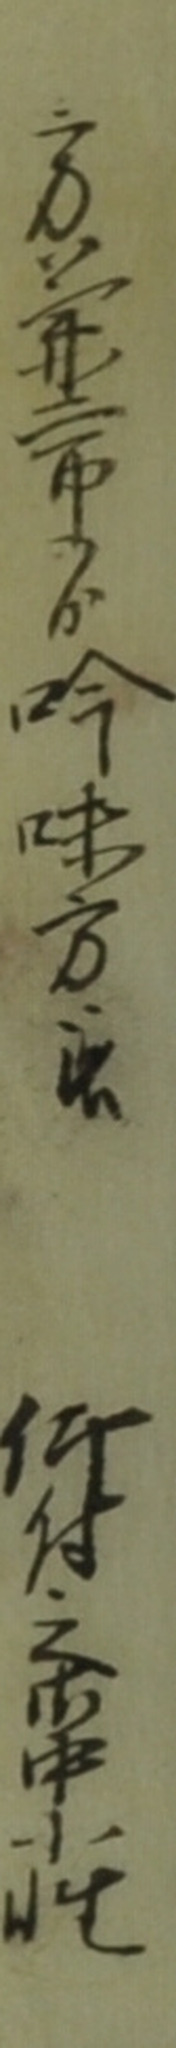方兼帯より吟味方被仰付之御中小姓
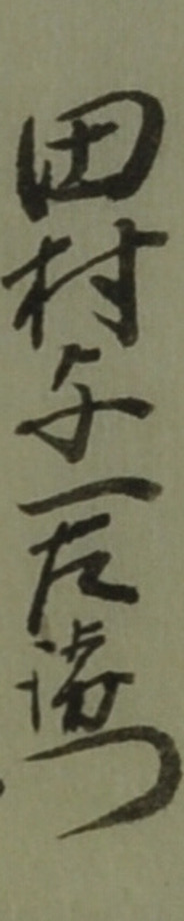田村与一左衛門
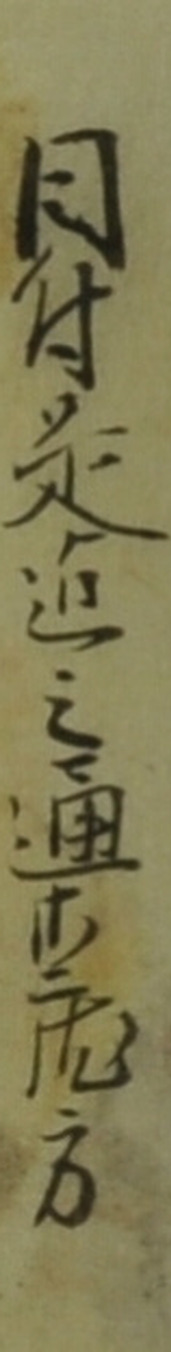目付是迄之通御蔵方御免
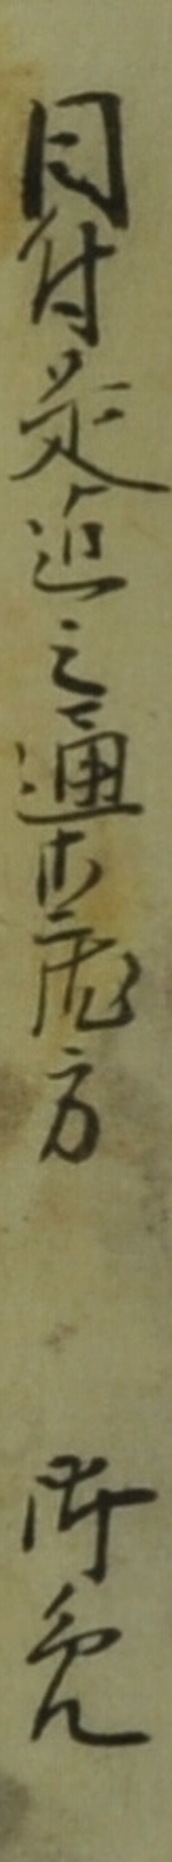目付是迄之通御蔵方御免

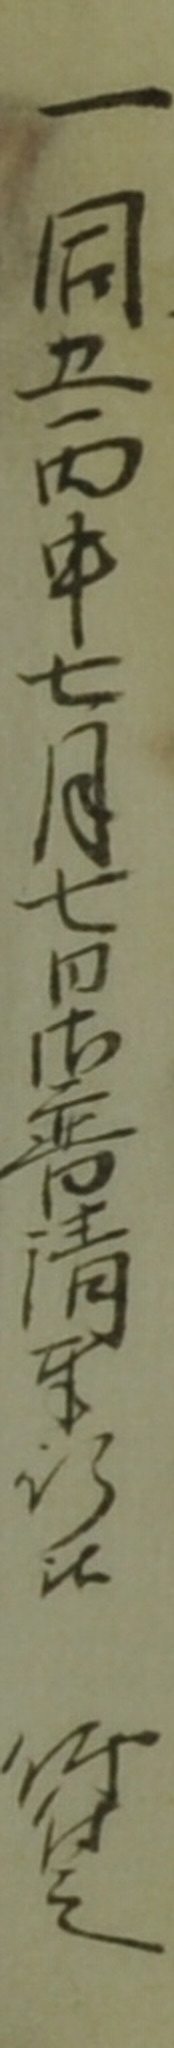一同五丙申七月七日御普請奉行被仰付之
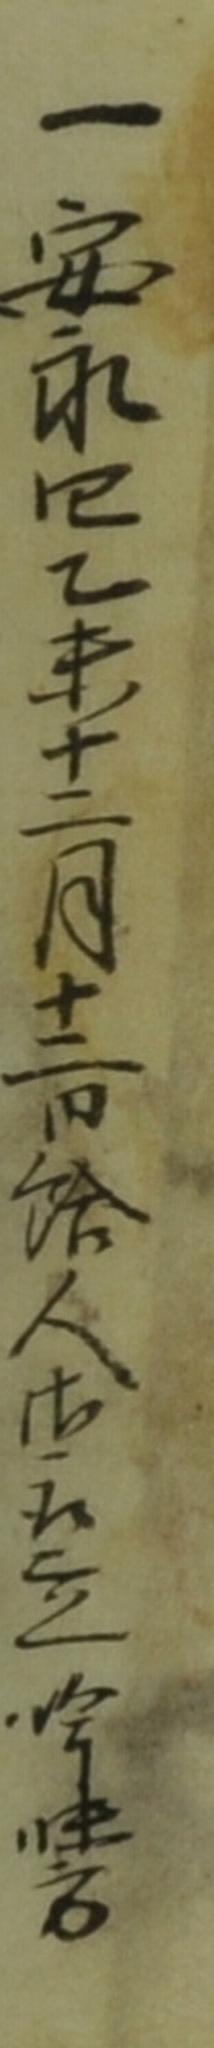一安永四乙未十二月十二日給人御取立吟味方
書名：諸御役代々録（八）
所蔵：伊那市立高遠町図書館・合同会社AMANE
